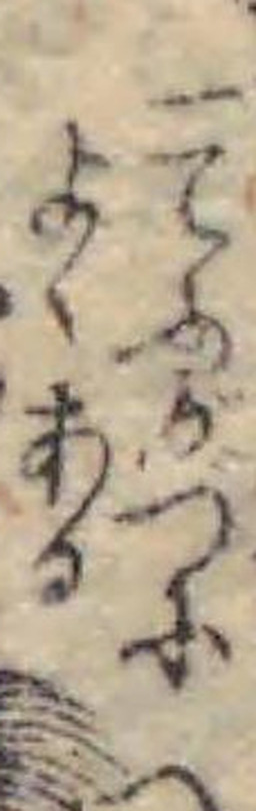よくある
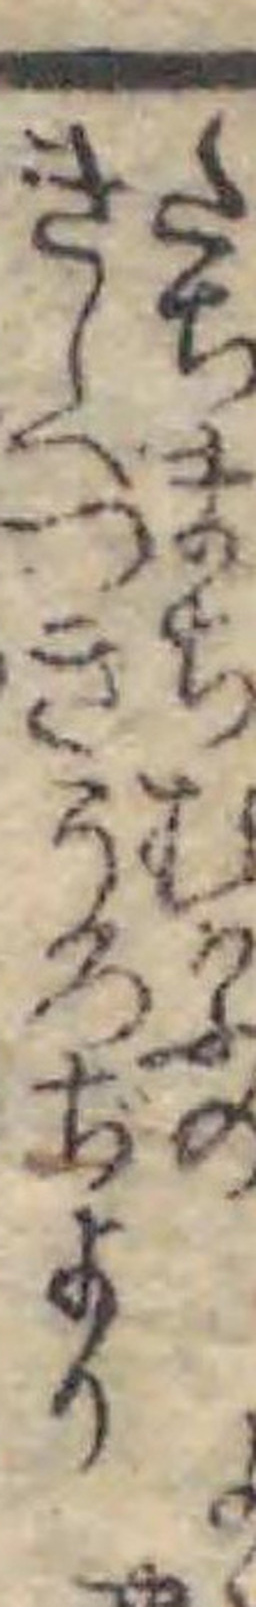きしへつきうろぢより
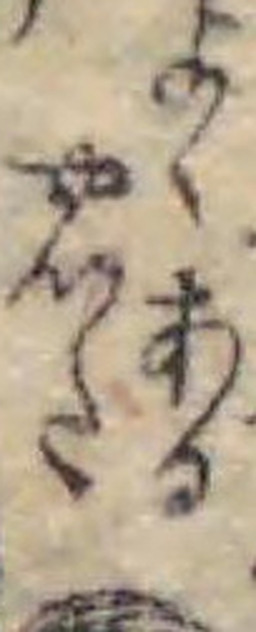やつた
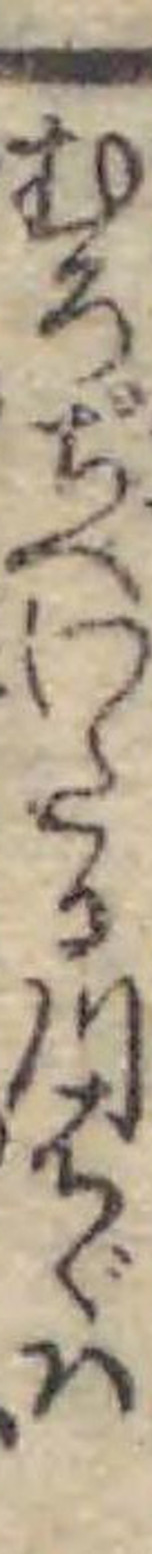むろぢへわたる川はゞは
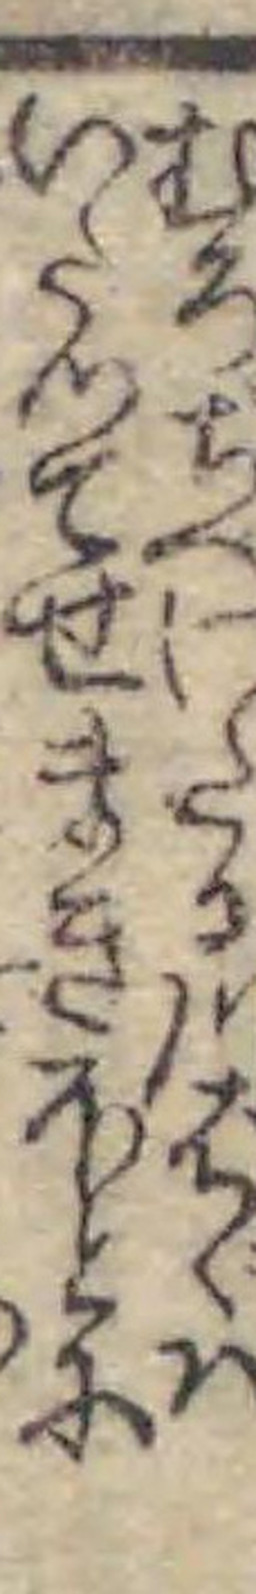いたつてせまきほとに
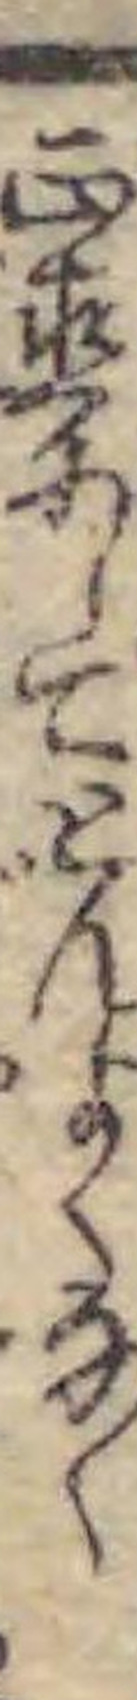正直にしてとんよくなく
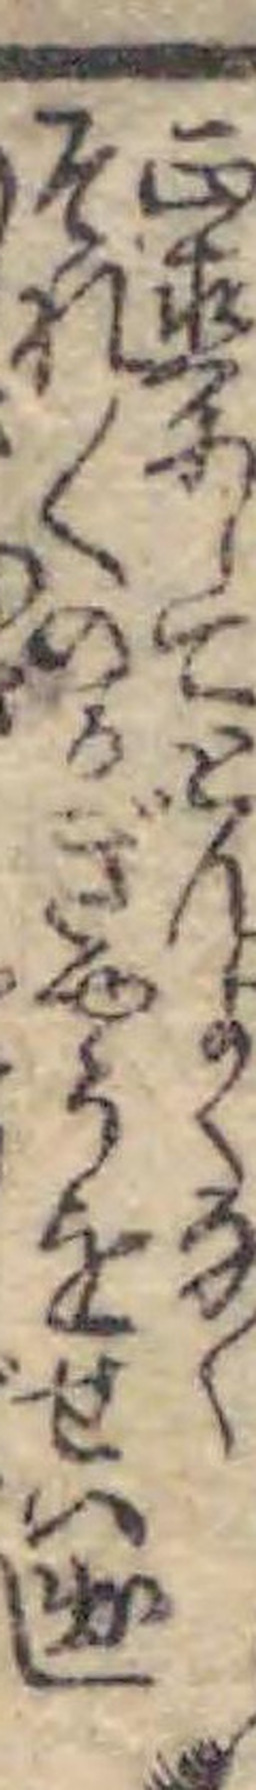それ〳〵のかぎやうをせい出し
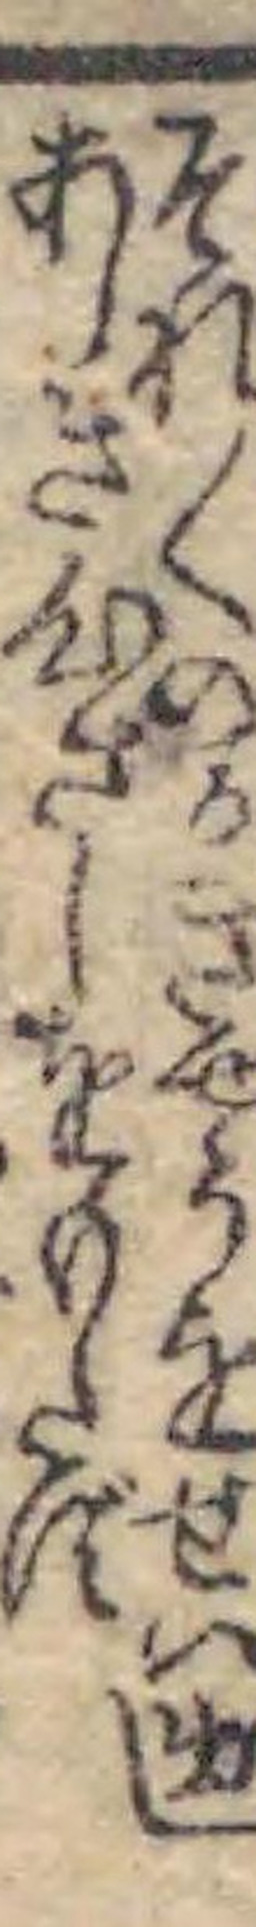あしき心さしをもたず
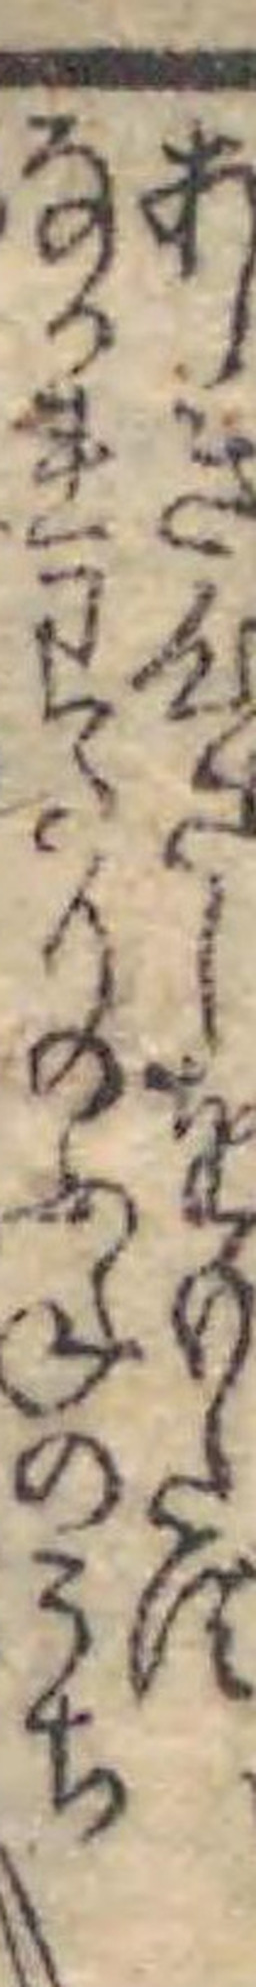なかれわたりのふねのうち
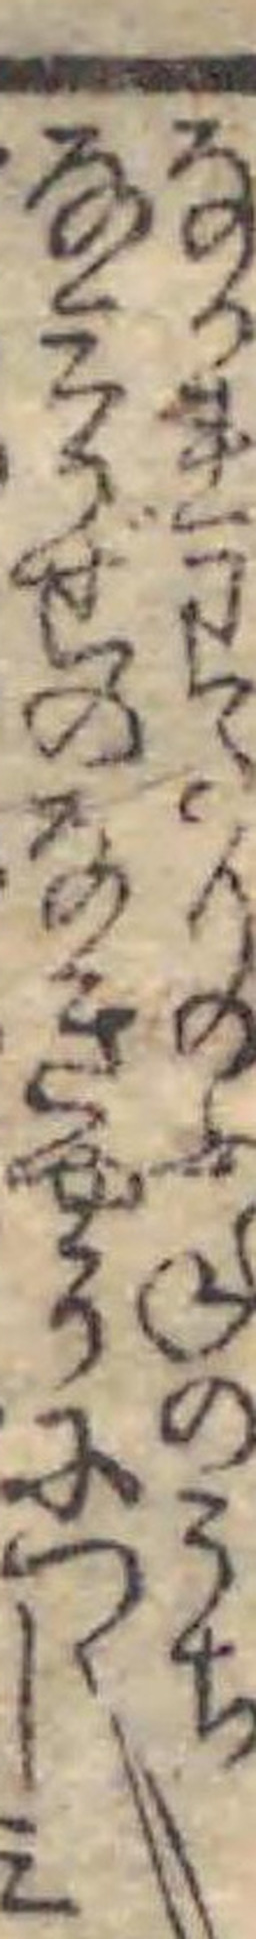なみかぜのなきやうにつゝ
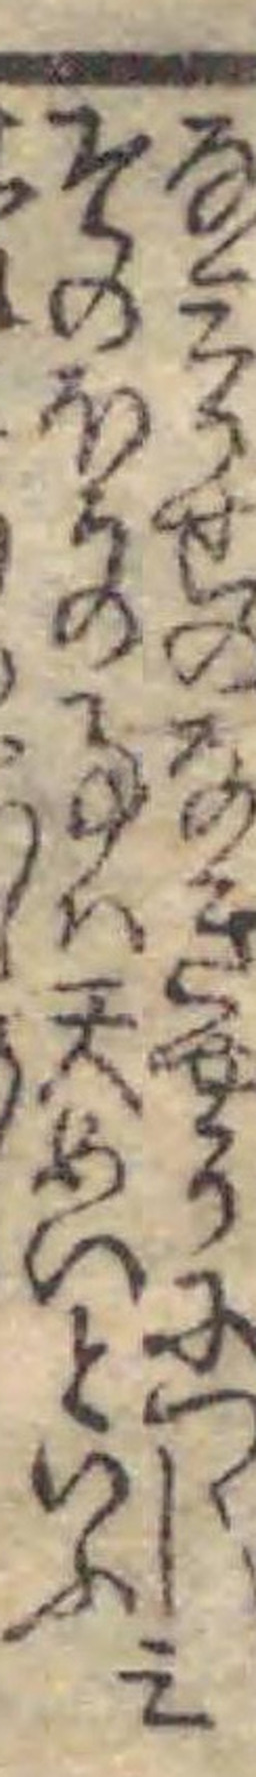そのかの事は天めいといふ
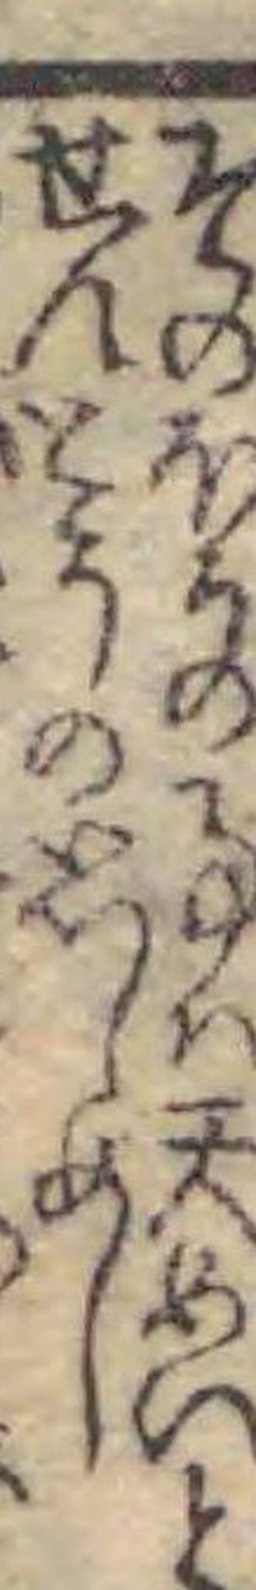せんとうの思しめし
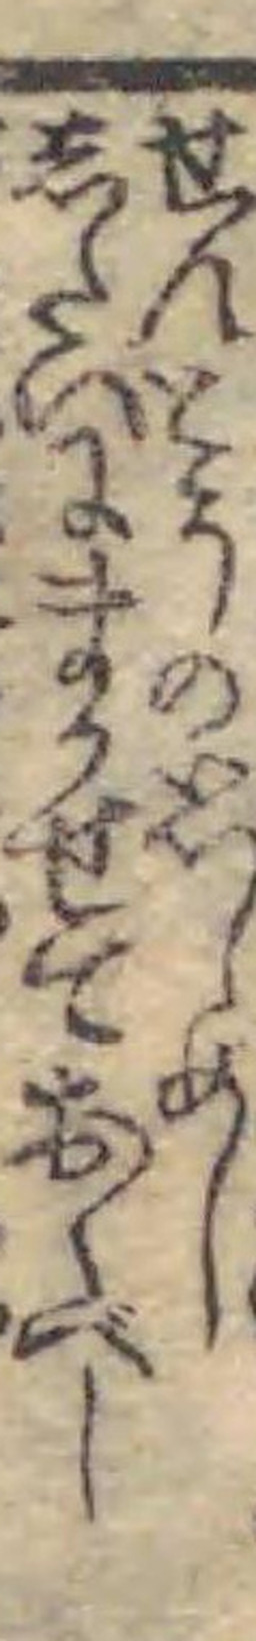したいにまかせておくべし
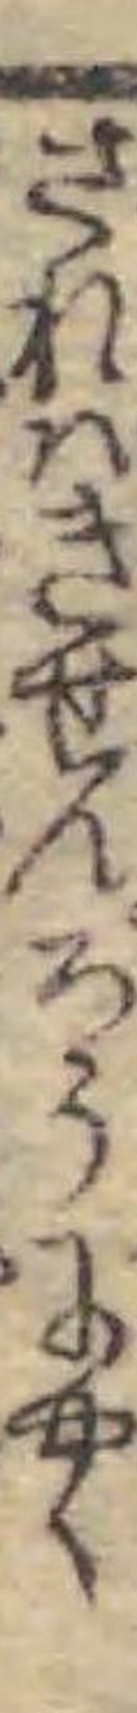されはきせんろうにやく
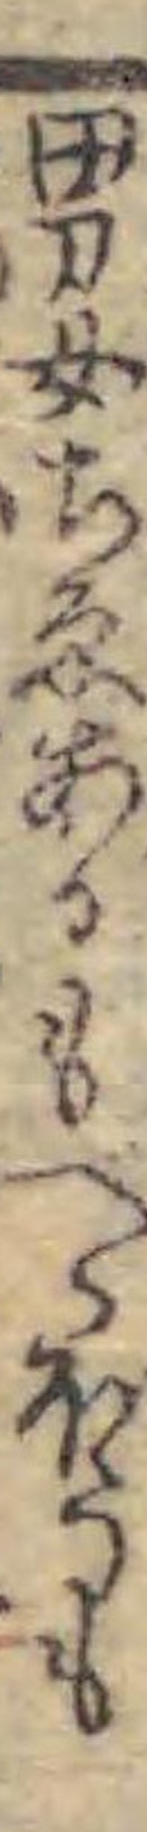男女ちゑあるもべらほうも
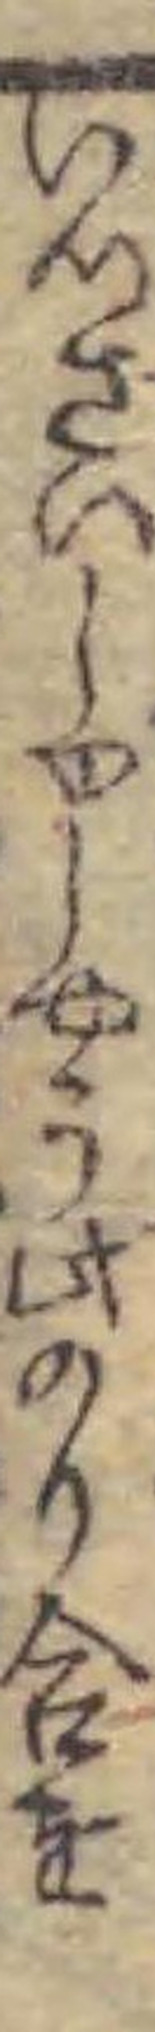いつさいしゆしやう此のり合を
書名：人心鏡写絵 : 3巻
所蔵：国立国会図書館 National Diet Library, JAPAN
